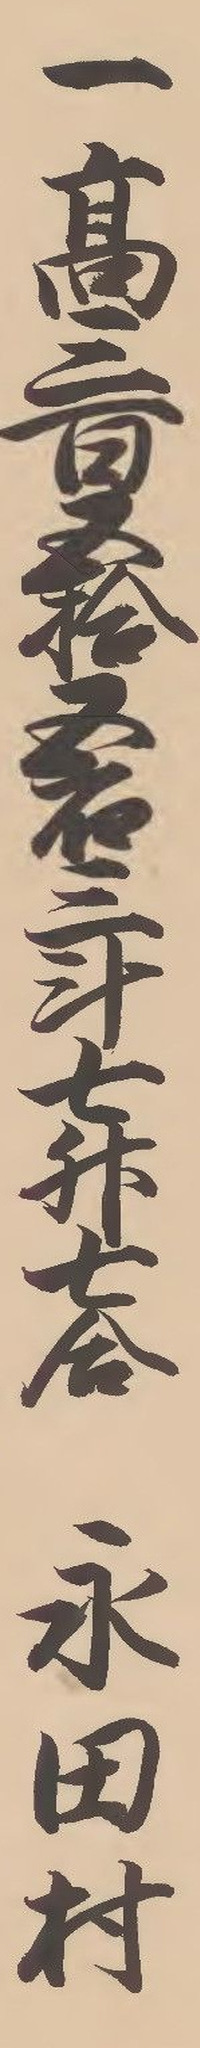一高三百五拾五石三斗七升七合永田村
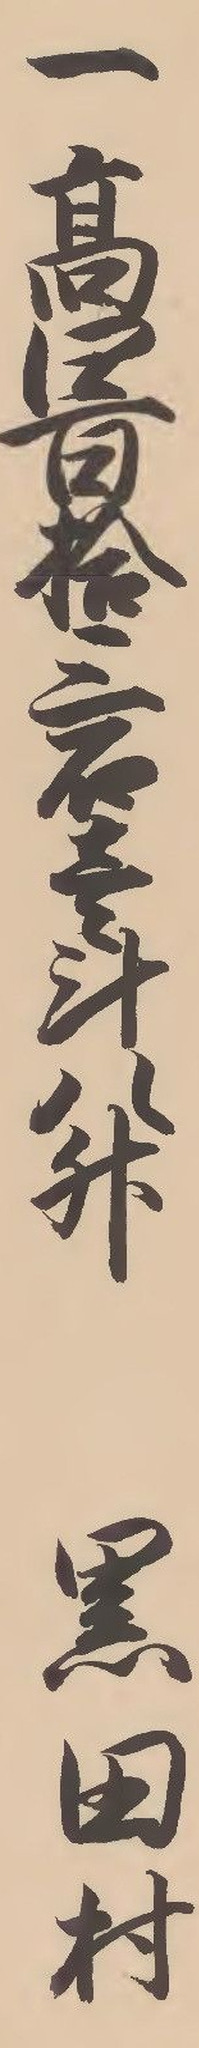一高四百拾三石壱斗八升黒田村
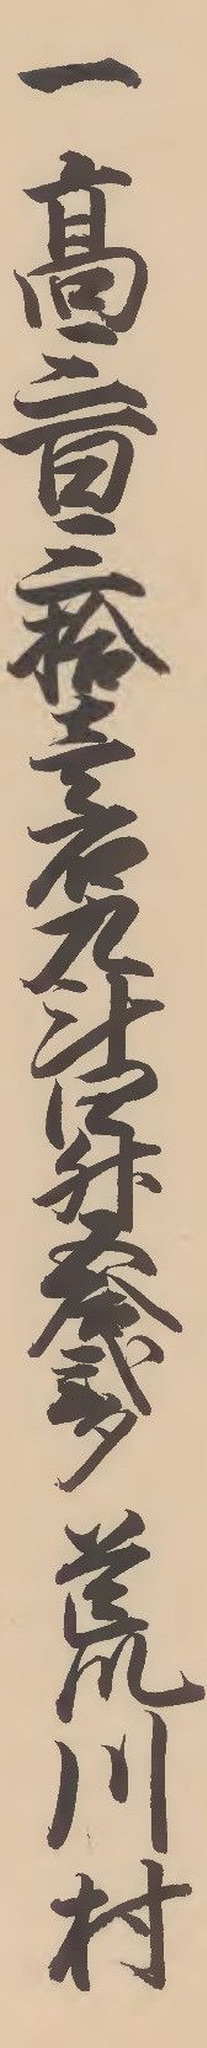一高三百三拾壱石九斗四升五合弐勺荒川村
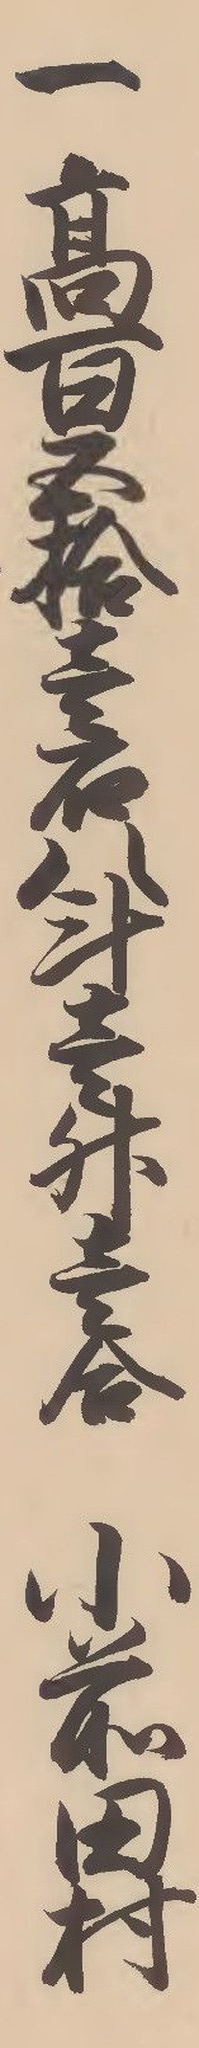一高百五拾壱石八斗壱升壱合小前田村
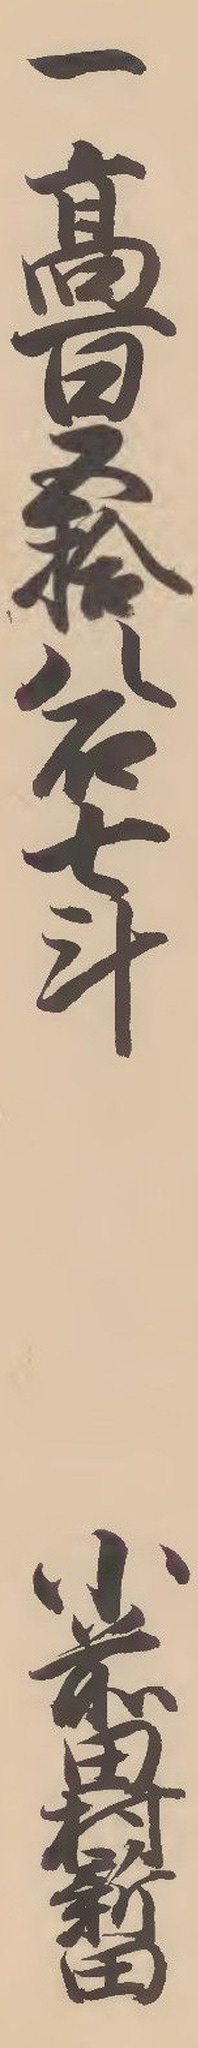一高百五拾八石七斗小前田村新田

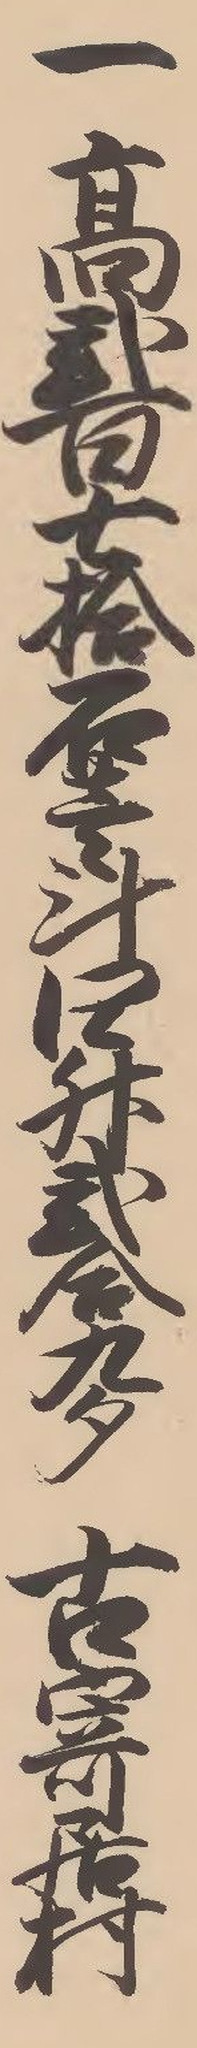一高弐百七拾石壱斗四升弐合九勺古寄居村
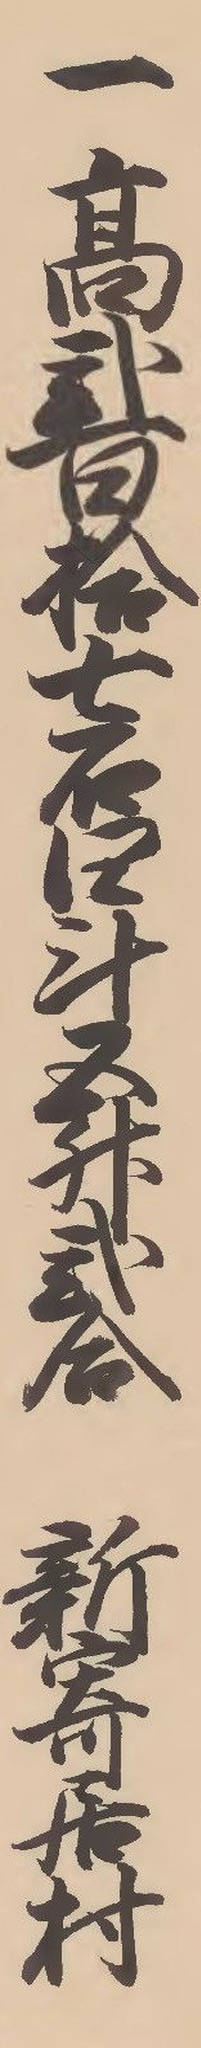一高弐百拾七石四斗五升弐合新寄居村
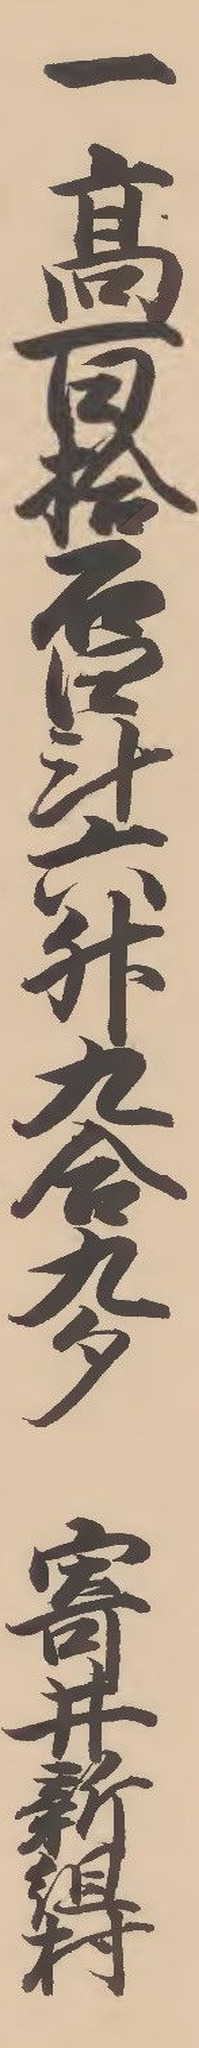一高百拾石四斗六升九合九勺寄井新組村
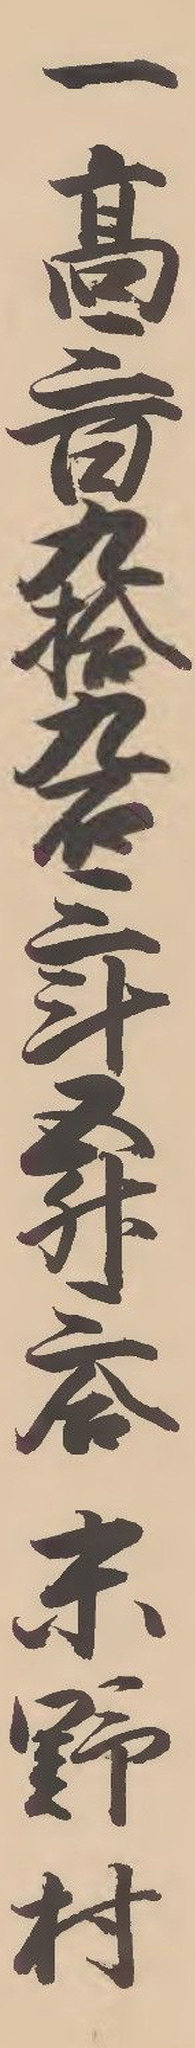一高三百九拾九石三斗五升三合末野村
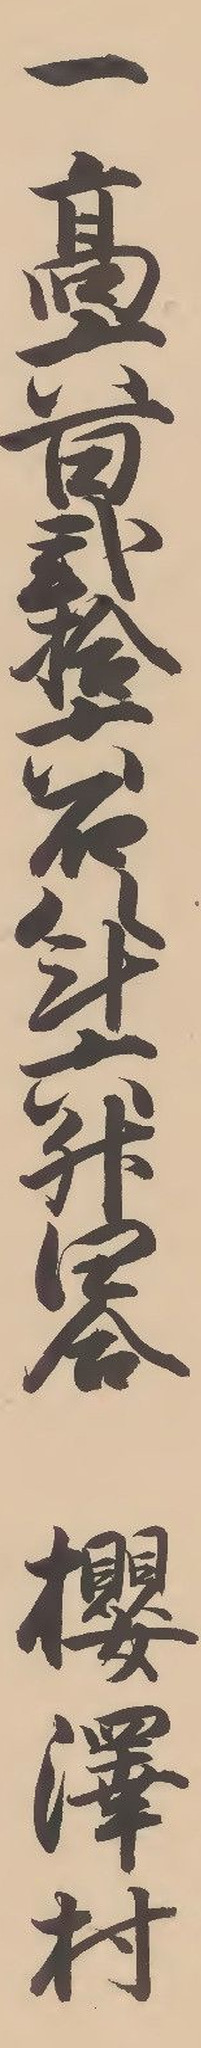一高六百弐拾六石八斗六升四合桜澤村
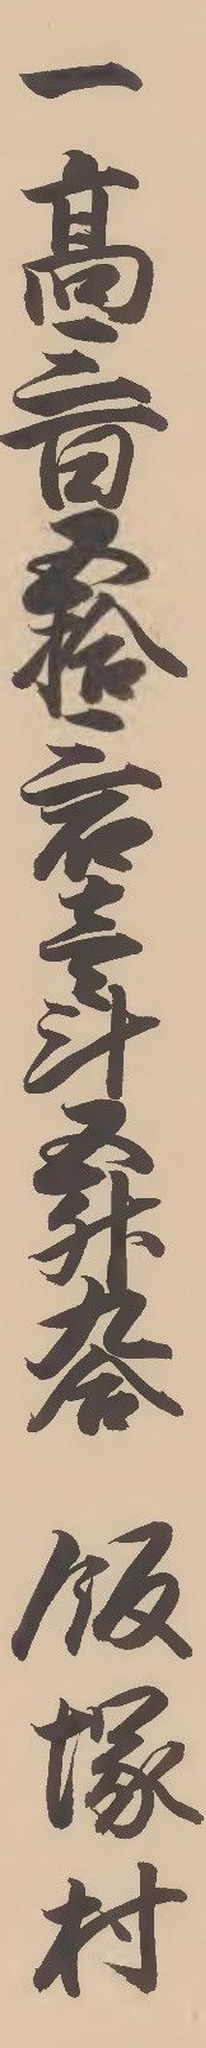一高三百五拾三石壱斗五升九合飯塚村
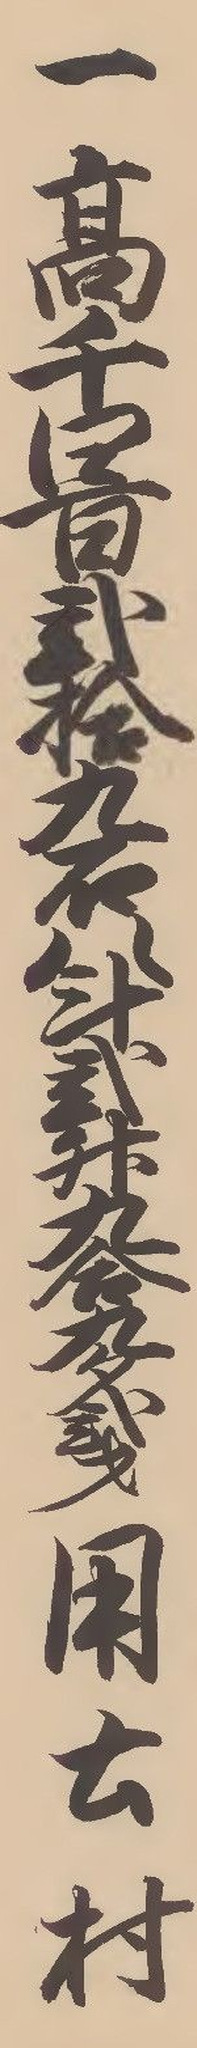一高千四百弐拾九石八斗弐升九合九勺武才用土村

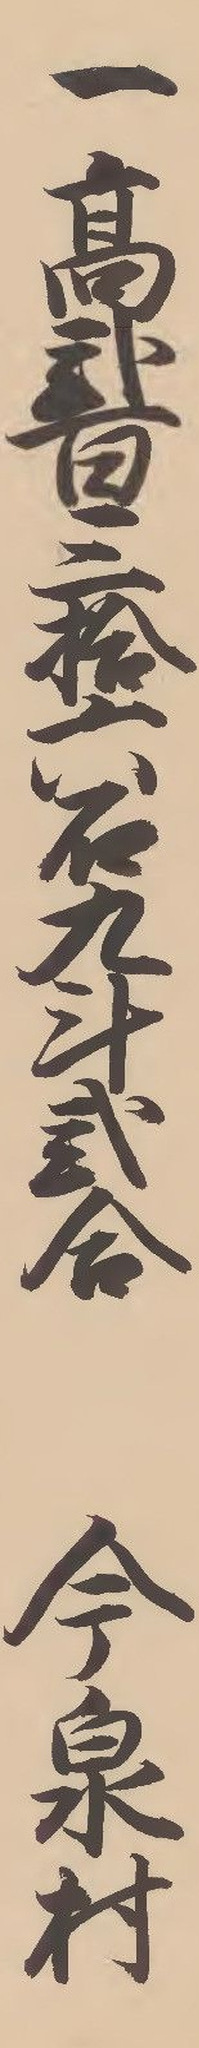一高弐百三拾六石九斗弐合今泉村
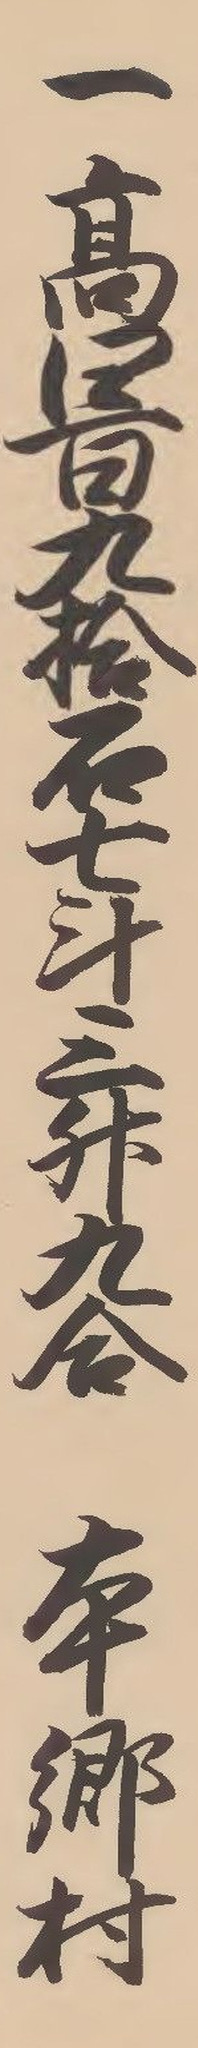一高四百九拾石七斗三升九合本郷村
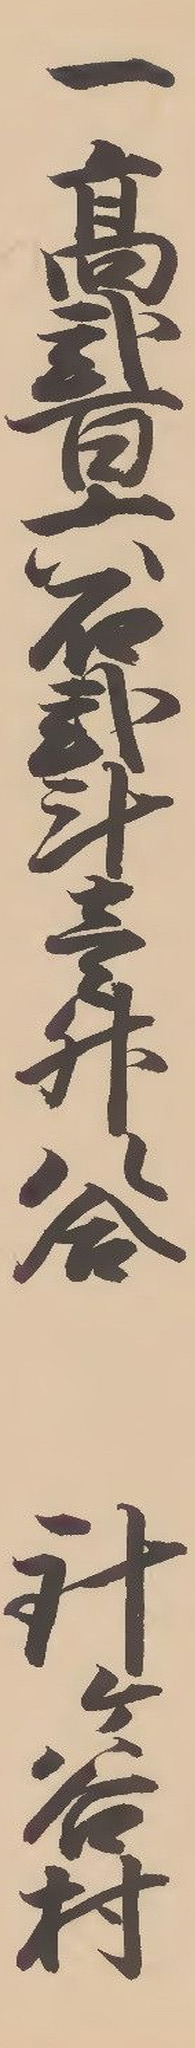一高弐百六石弐斗壱升八合針ヶ谷村
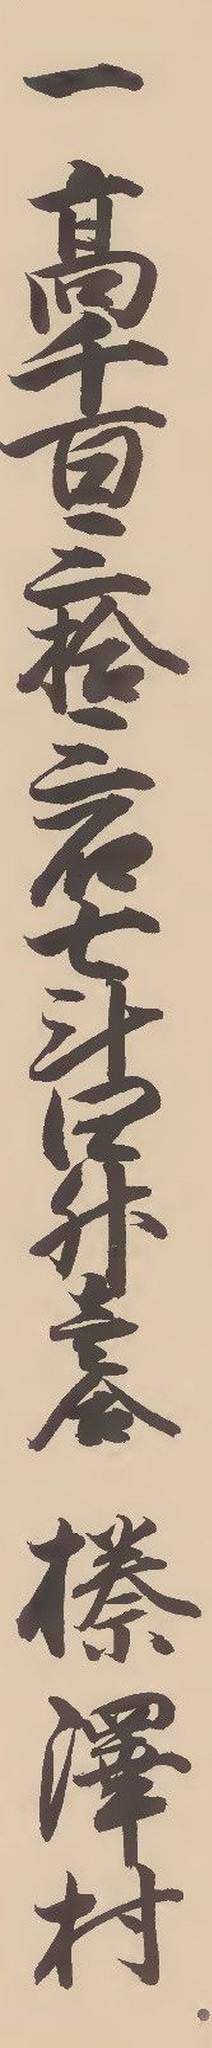一高千百三拾三石七斗四升壱合榛澤村
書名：武蔵国郷帳　下
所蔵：国立公文書館 National Archives of Japan
